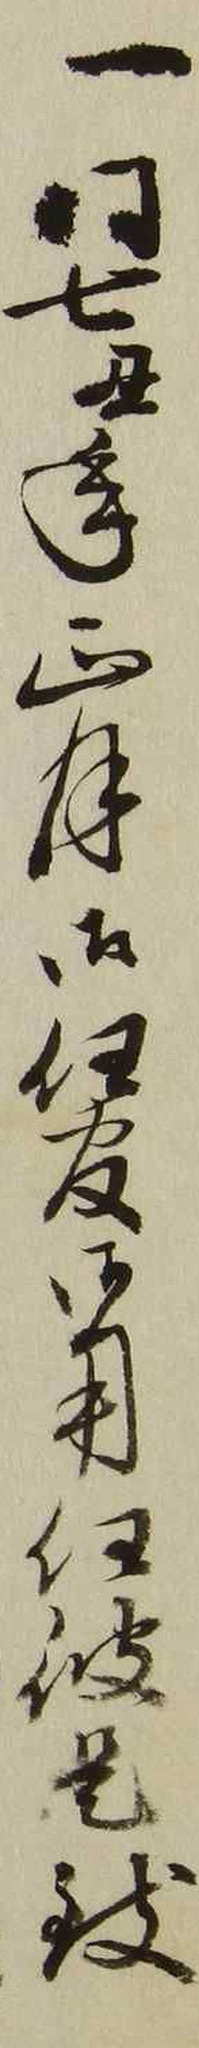一同七丑年正月御任官御用任彼是致
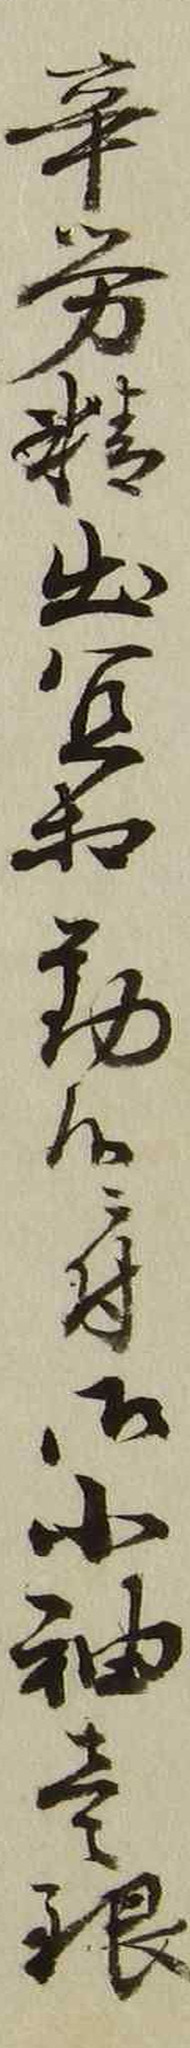辛労精出宜相勤候付ニ御小袖壱銀
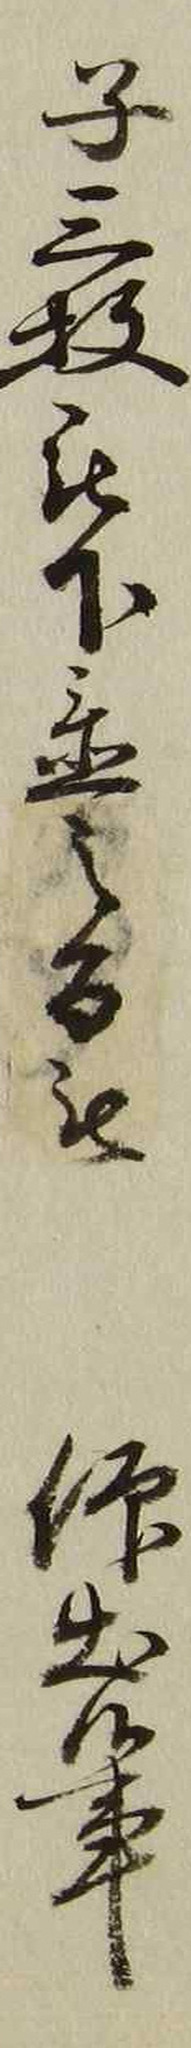子三枚被下置之旨被仰出候事
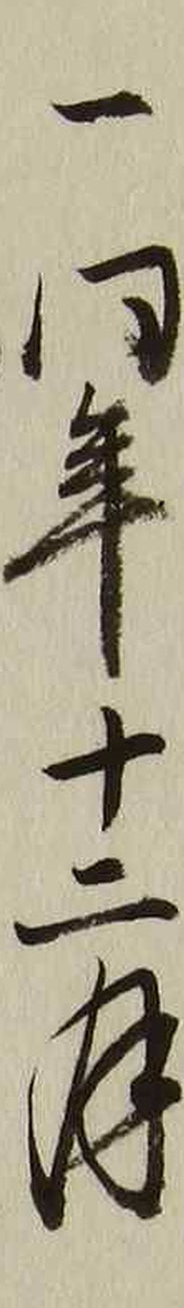一同年十二月
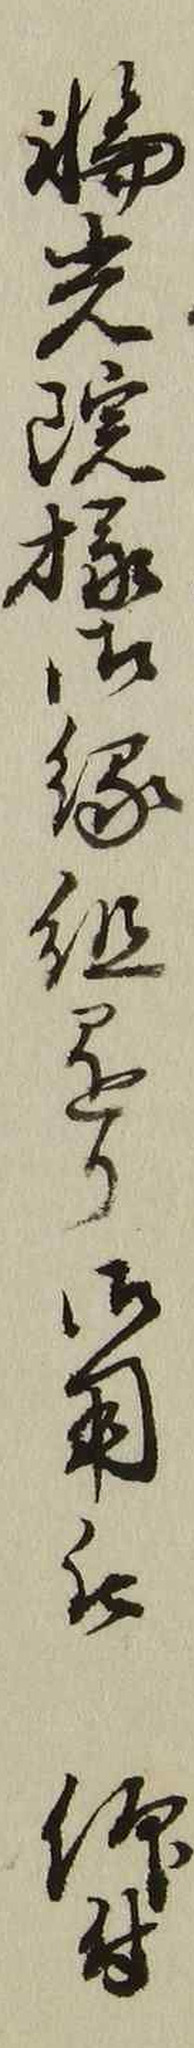輪光院様御縁組懸り御用被仰付
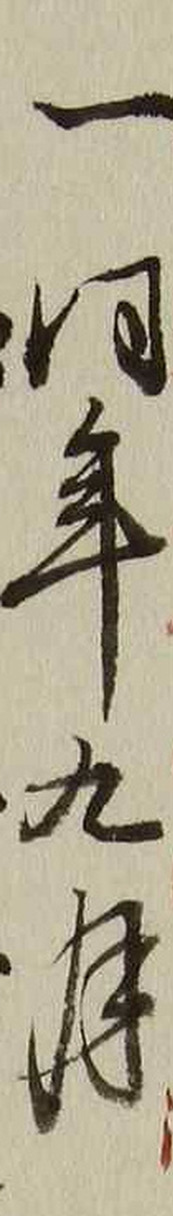一同年九月
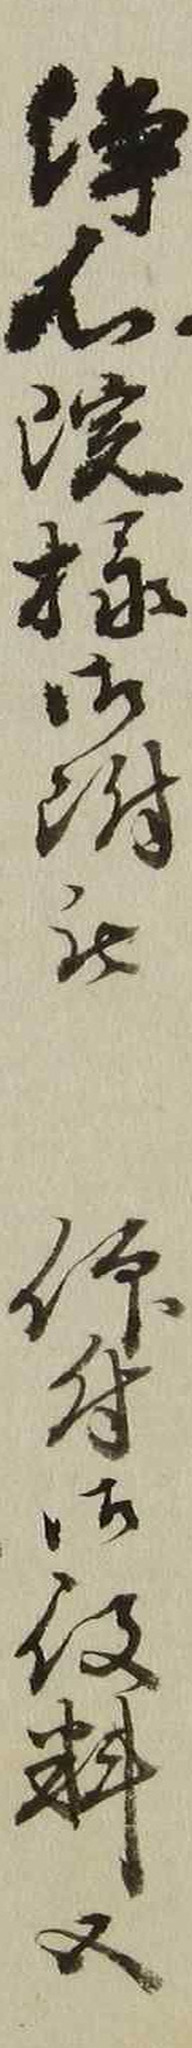浄心院様御附被仰付御役料五
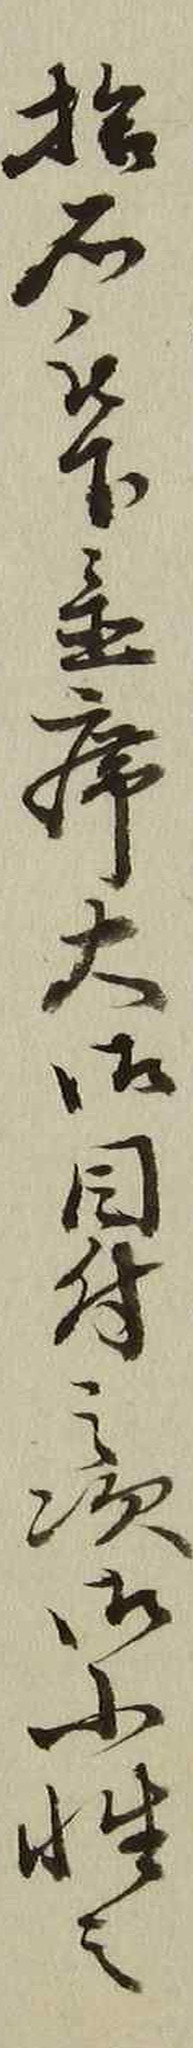拾石被下置席大御目付之次御小性之
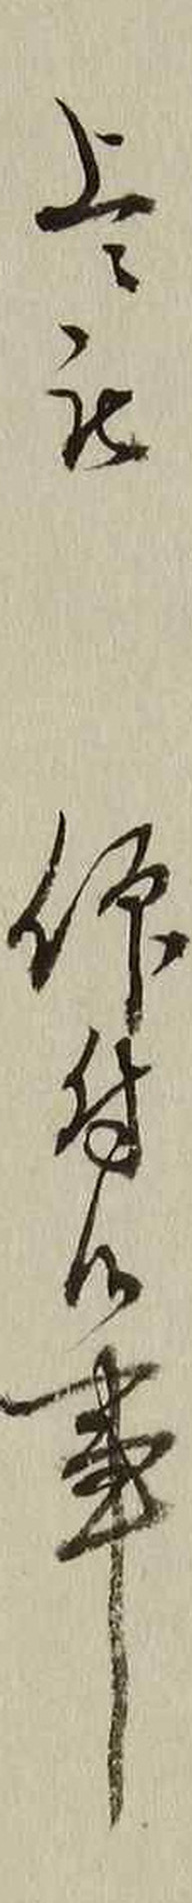上ニ被仰付候事
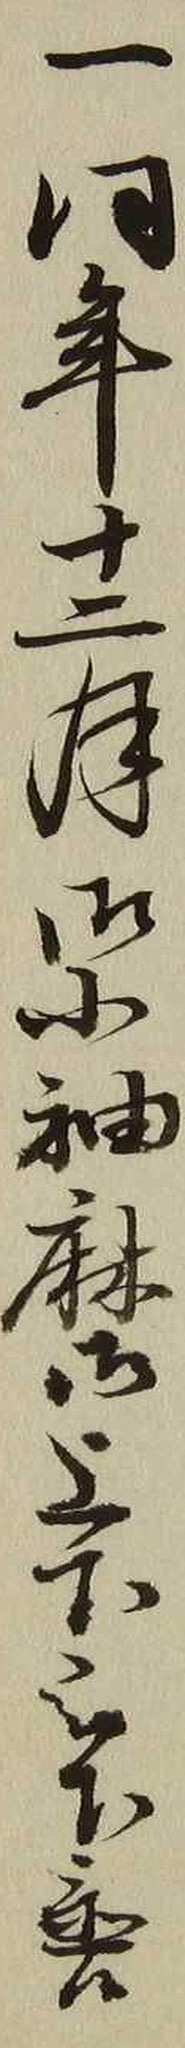一同年十二月御小袖麻御上下被下置候
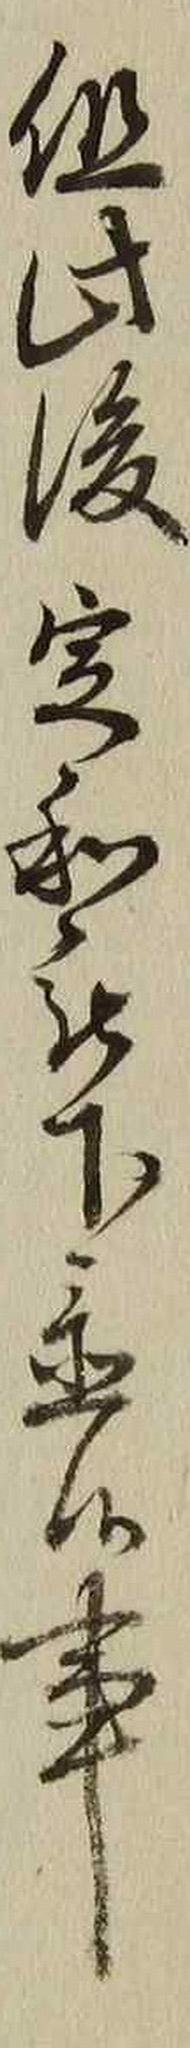但此後定和被下置候事
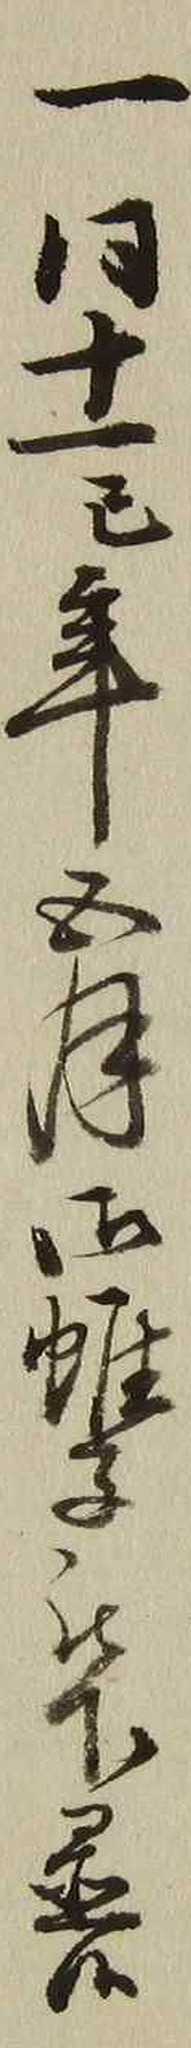一同十一巳年五月御帷子被下置候
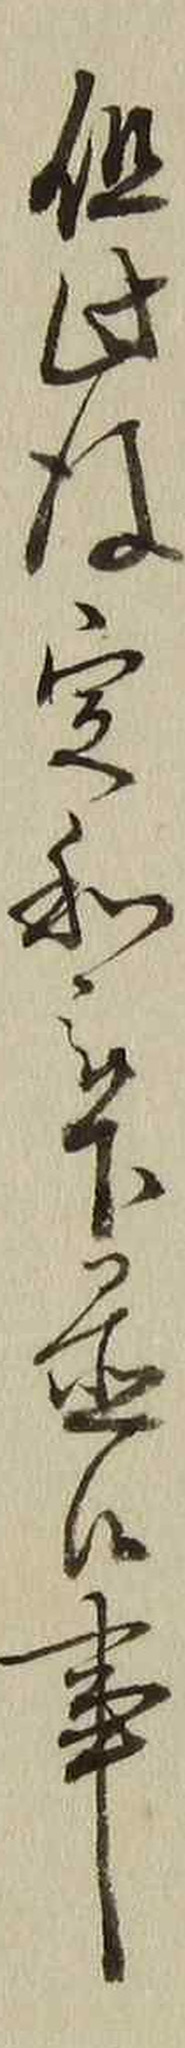但此後定和被下置候事
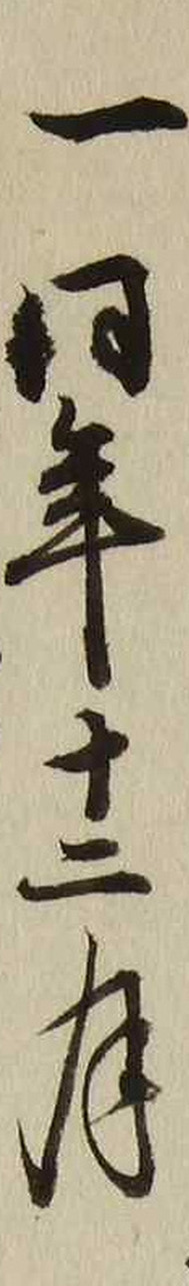一同年十二月
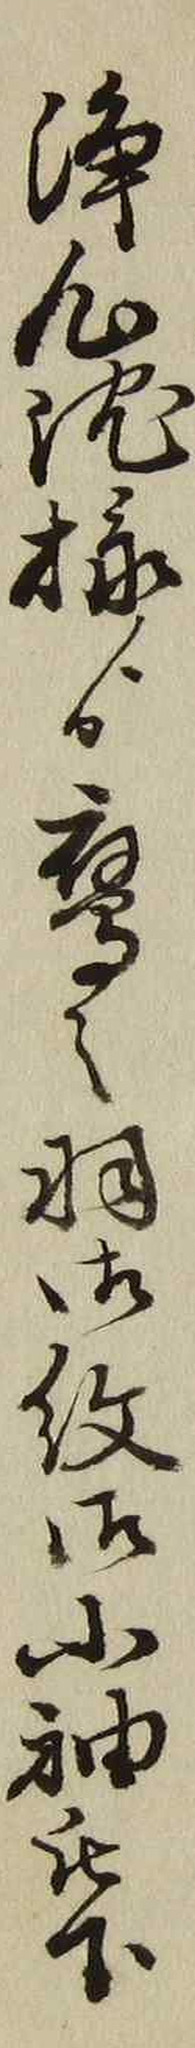浄心陀様ゟ鷹之羽御紋御小袖被下
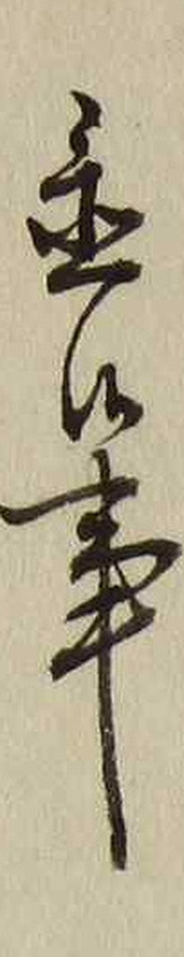置候事
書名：諸士系譜　巻之35　は之部3
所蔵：会津若松市立会津図書館
